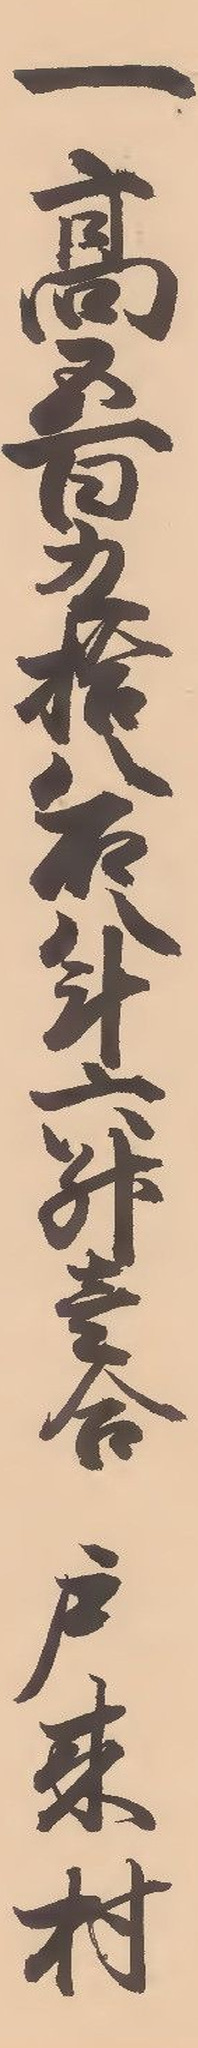一高五百九拾八石八斗六升壱合戸来村
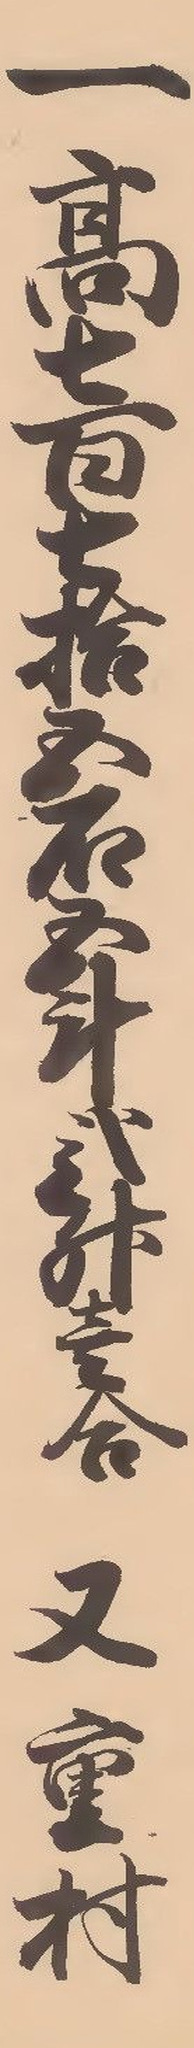一高七百七拾五石五斗弐升壱合又重村
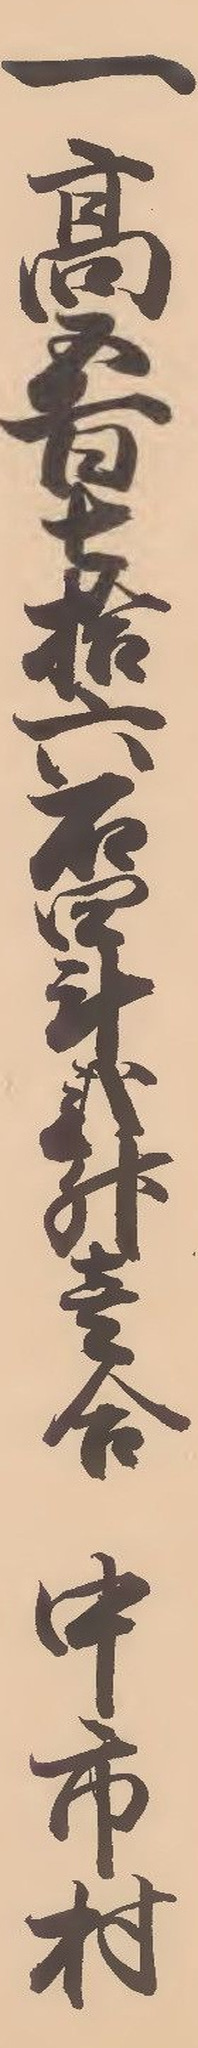一高五百七拾六石四斗弐升壱合中市村
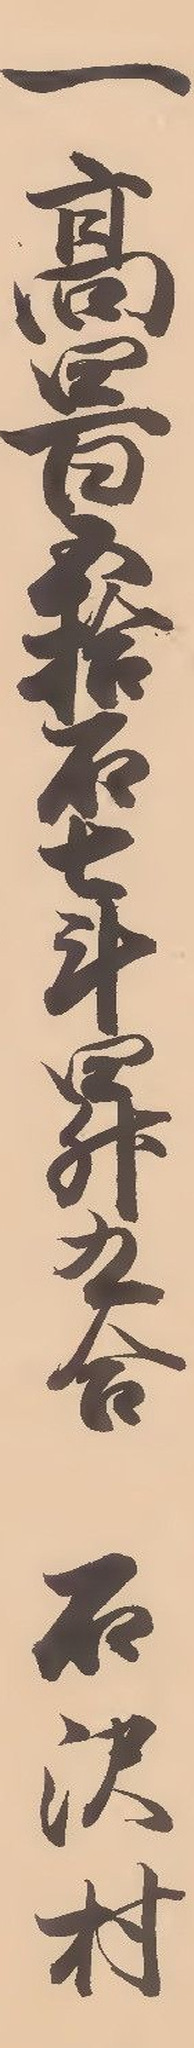一高四百五拾石七斗四升九合石沢村
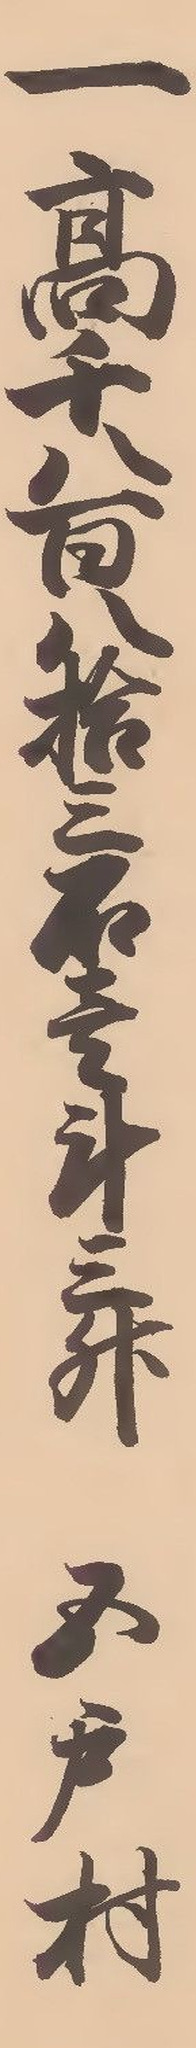一高千八百八拾三石壱斗三升五戸村

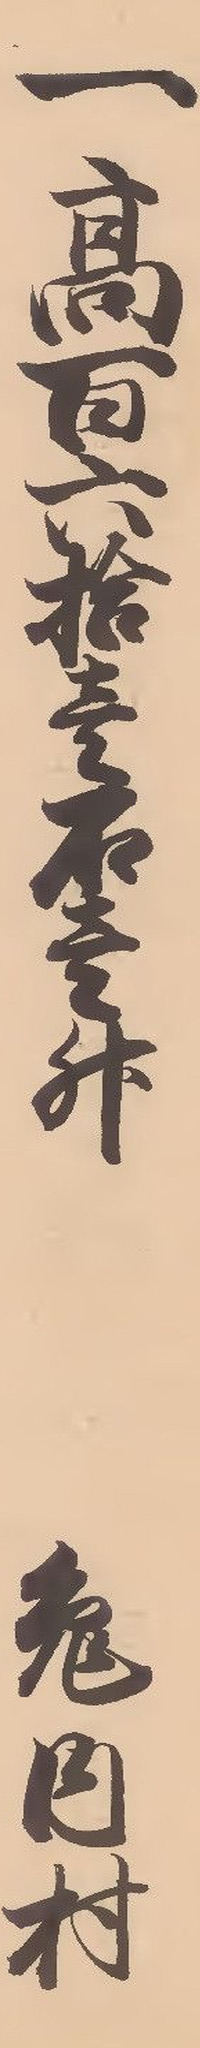一高百六拾壱石壱升兎内村
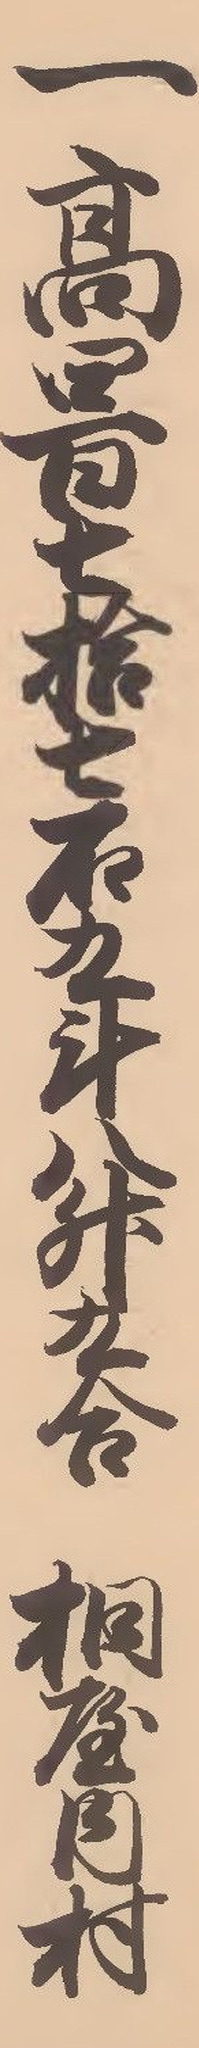一高四百七拾七石九斗八升九合桐屋内村
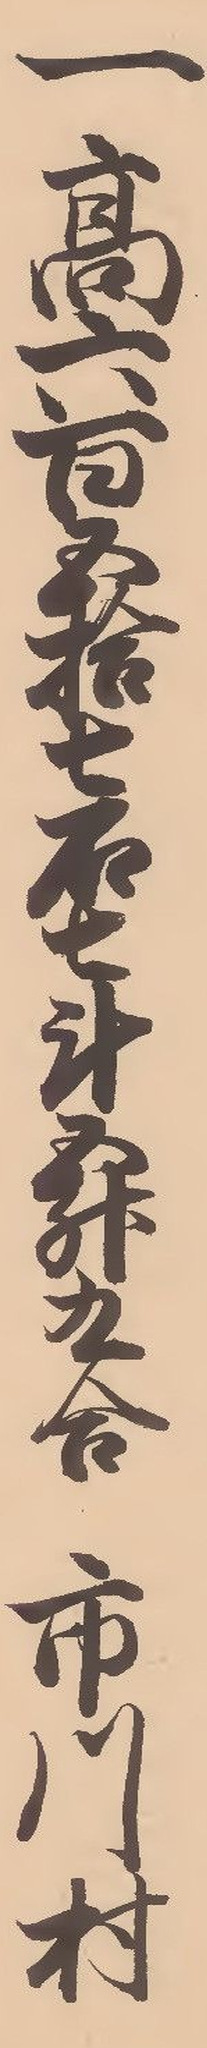一高六百五拾七石七斗五升九合市川村
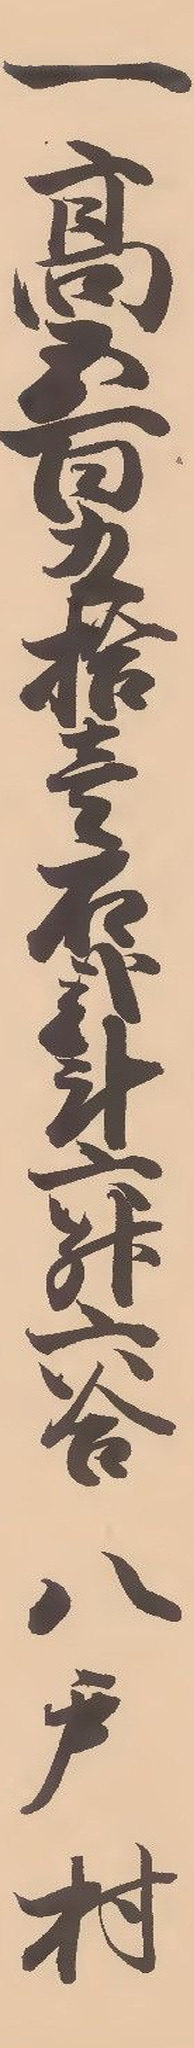一高五百九拾壱石弐斗六升六谷八戸村
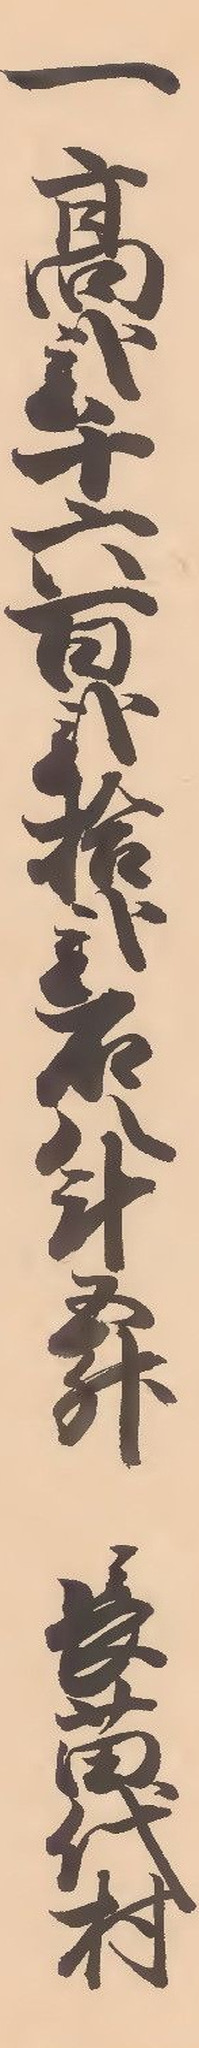一高弐千六百弐拾弐石八斗五升長苗代村
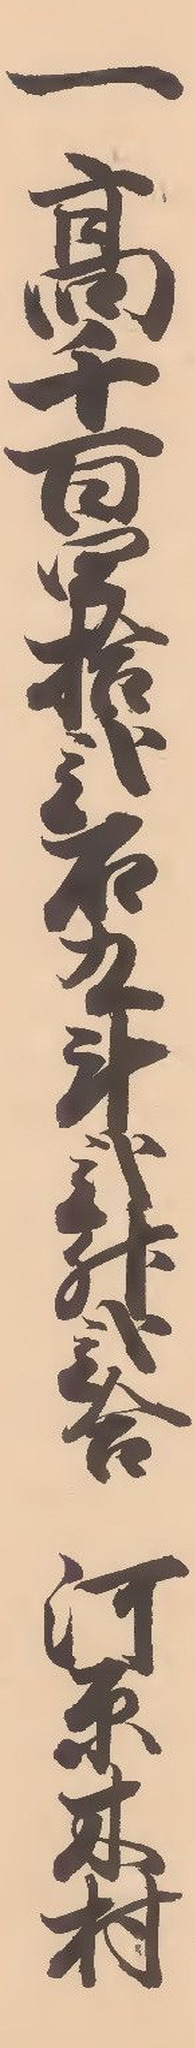一高千百四拾弐石九斗弐升弐合河原木村
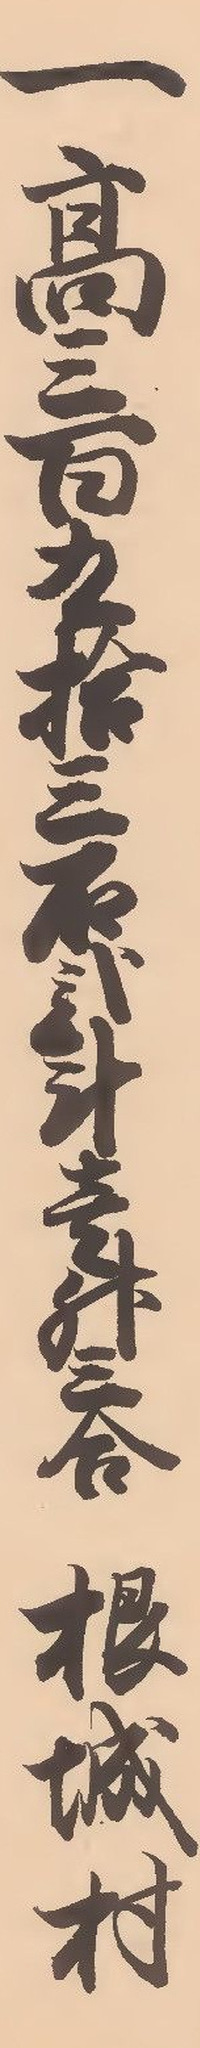一高三百九拾三石弐斗壱升三合根城村
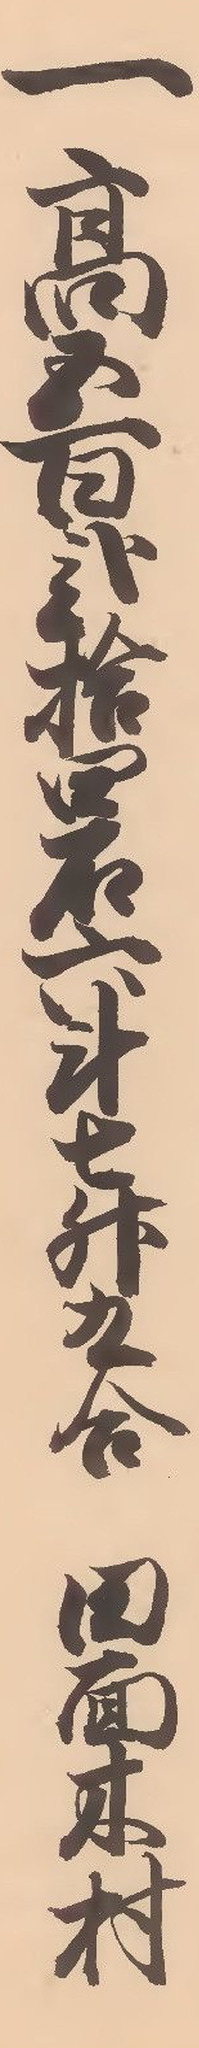一高五百弐拾四石六斗七升九合田面木村

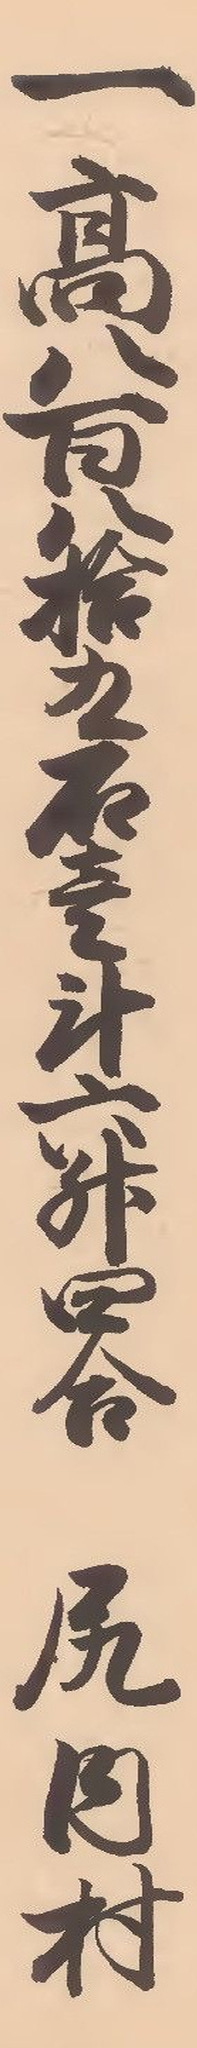一高八百八拾九石壱斗六升四合尻内村
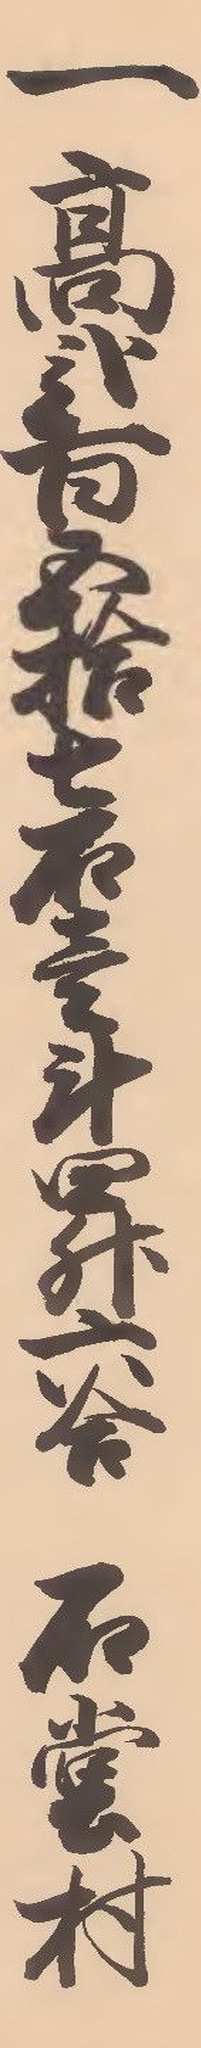一高弐百五拾七石壱斗四升六合石堂村
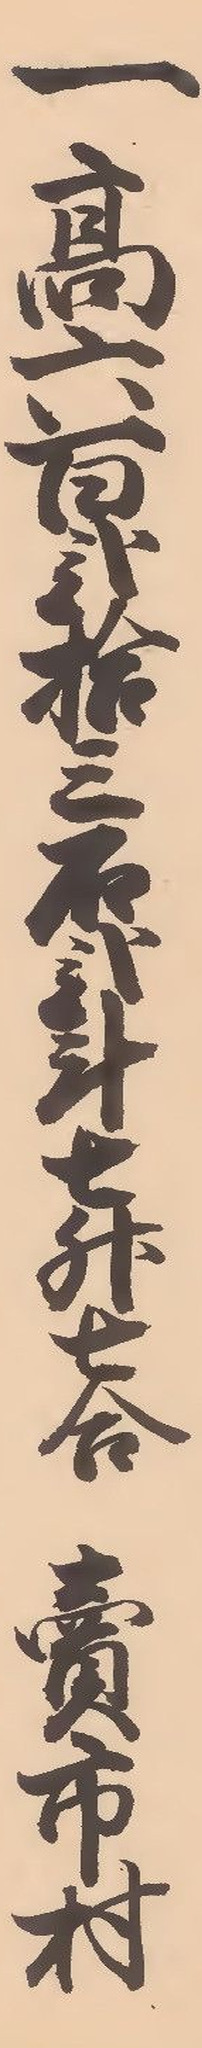一高六百弐拾三石弐斗七升七合売市村
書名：陸奥国郷帳　６
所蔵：国立公文書館 National Archives of Japan
